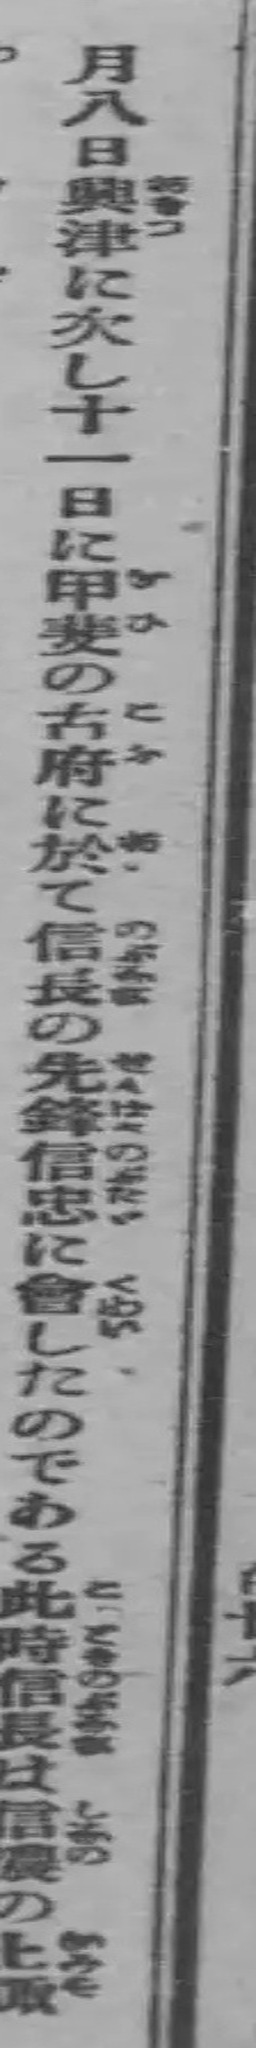月八日興津に次し十一日に甲斐の古府に於て信長の先鋒信忠に会したのである此時信長は信濃の上諏
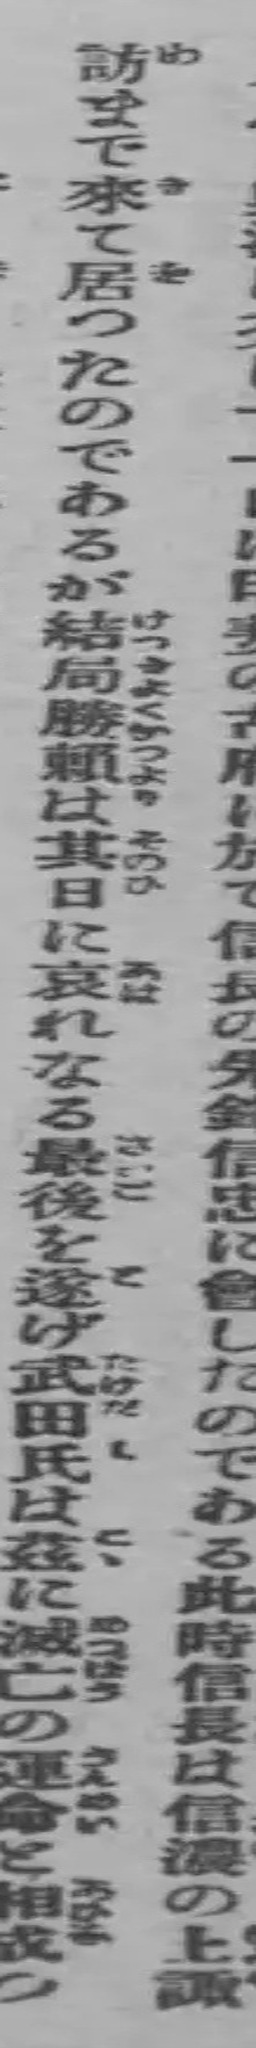訪まで来て居つたのであるが結局勝頼は其日に哀れなる最後を遂げ武田氏は茲に滅亡の運命と相成つ
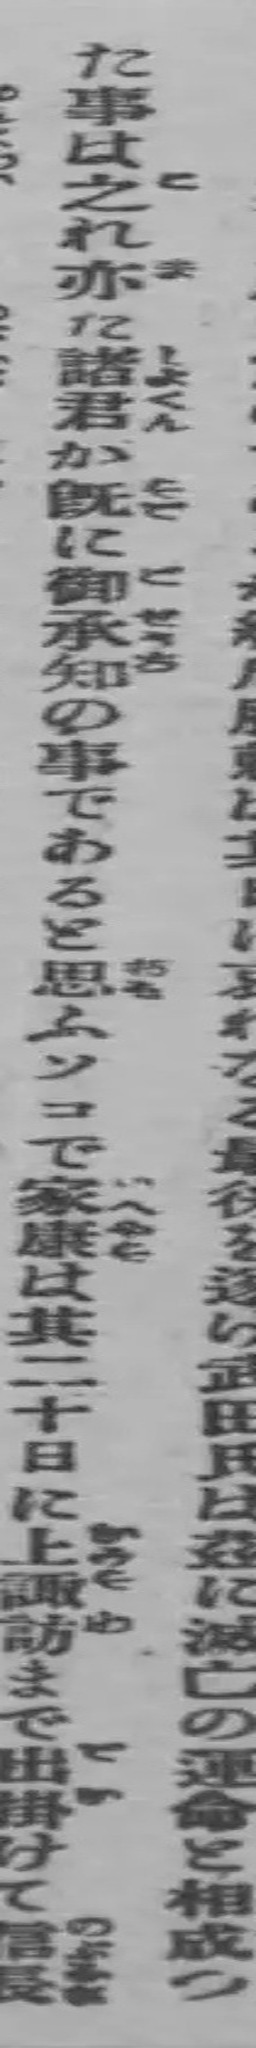た事は之れ亦た諸君か既に御承知の事であると思ふソコで家康は其二十日に上諏訪まで出掛けて信長
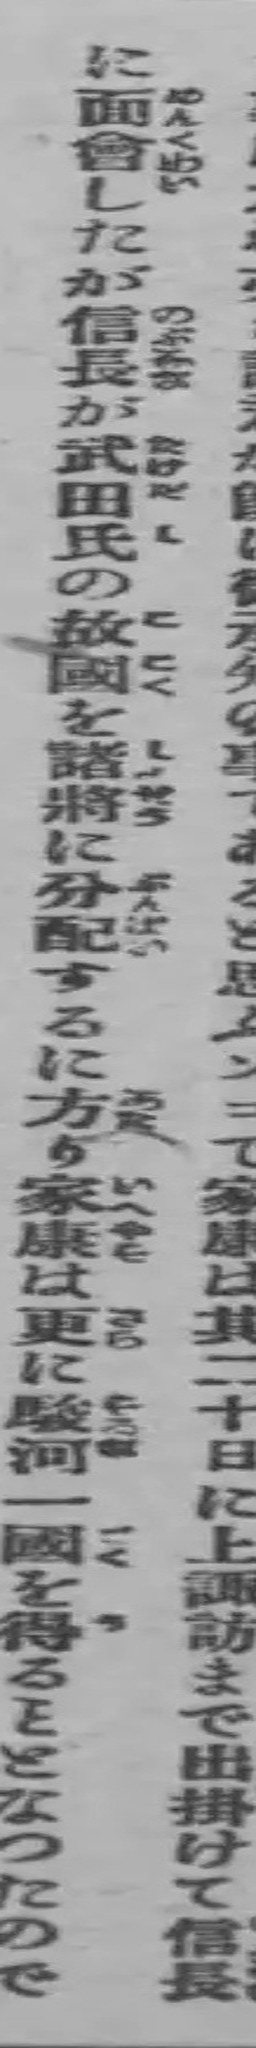に面会したが信長が武田氏の故国を諸将に分配するに方り家康は更に駿河一国を得ることとなつたので
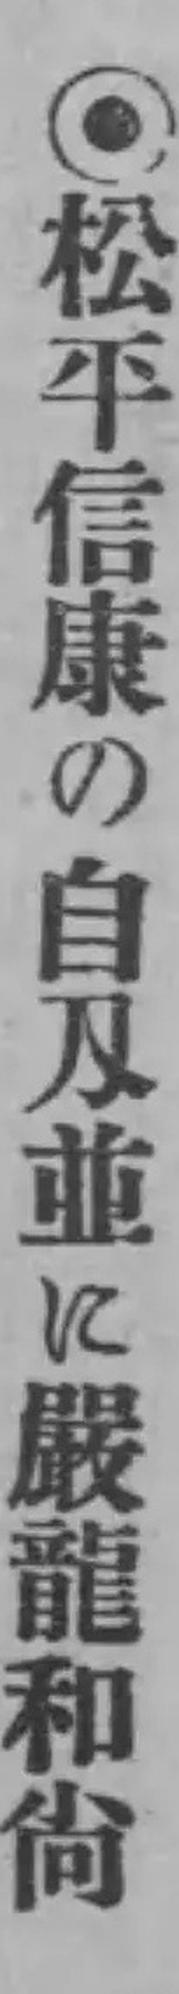⦿松平信康の自刃並に厳龍和尚
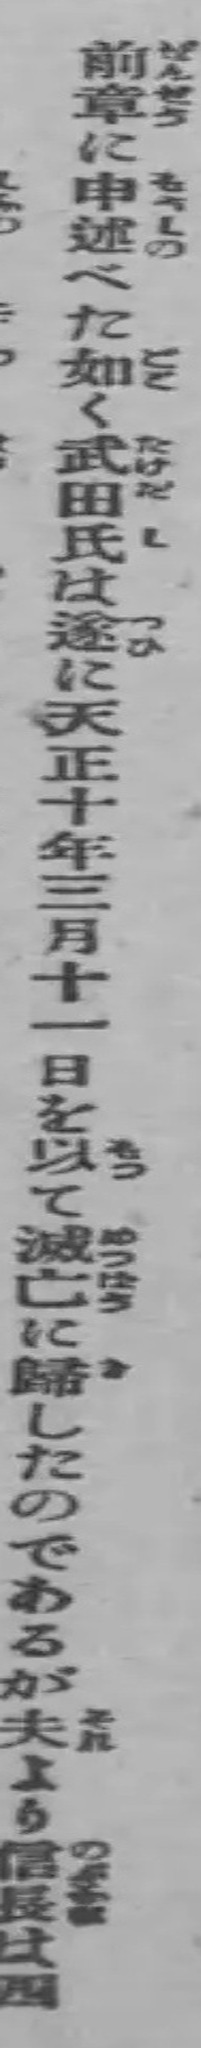前章に申述べた如く武田氏は遂に天正十年三月十一日を以て滅亡に帰したのであるが夫より信長は四
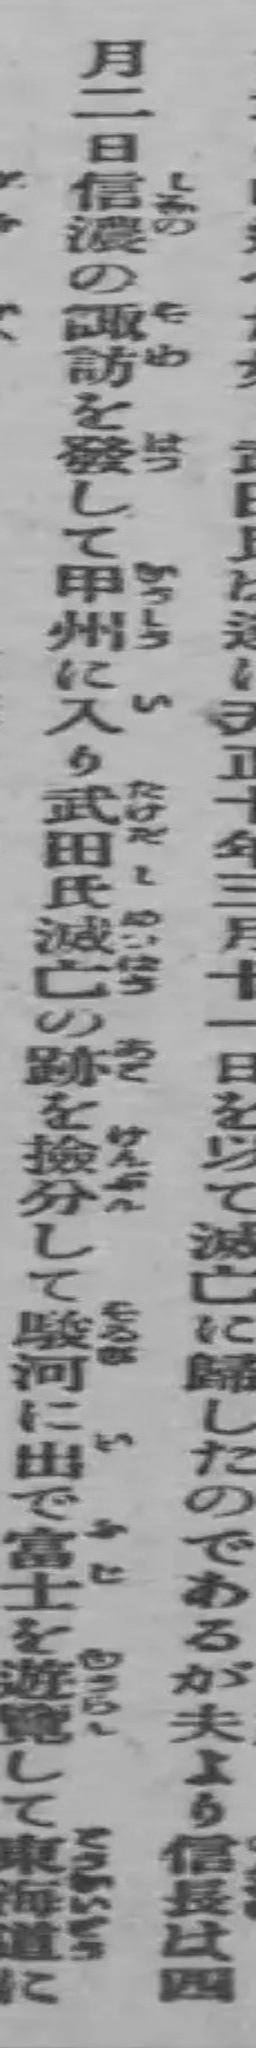月二日信濃の諏訪を発して甲州に入り武田氏滅亡の跡を検分して駿河に出で富士を遊覧して東海道に
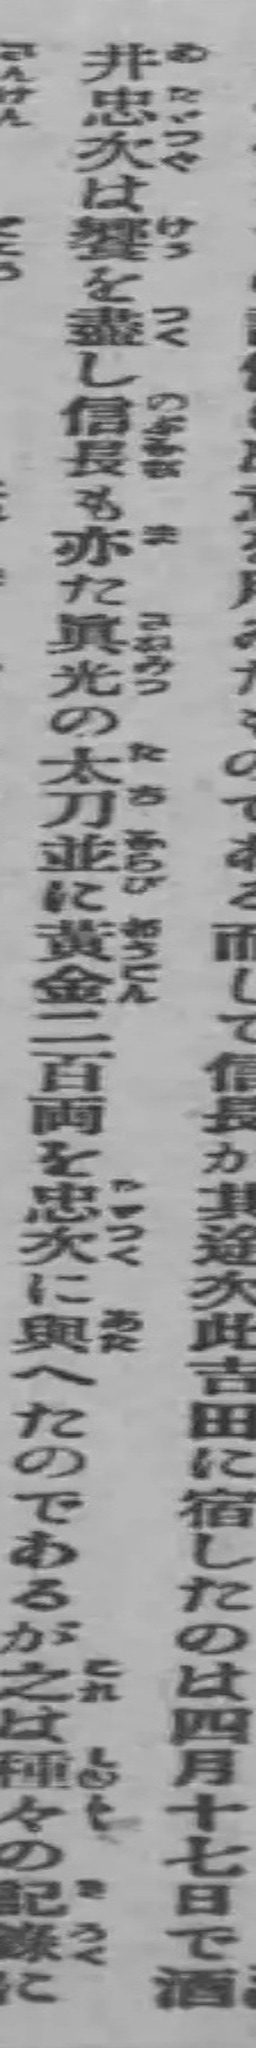井忠次は饗を尽し信長も亦た眞光の太刀並に黄金二百両を忠次に与へたのであるが之は種々の記録に
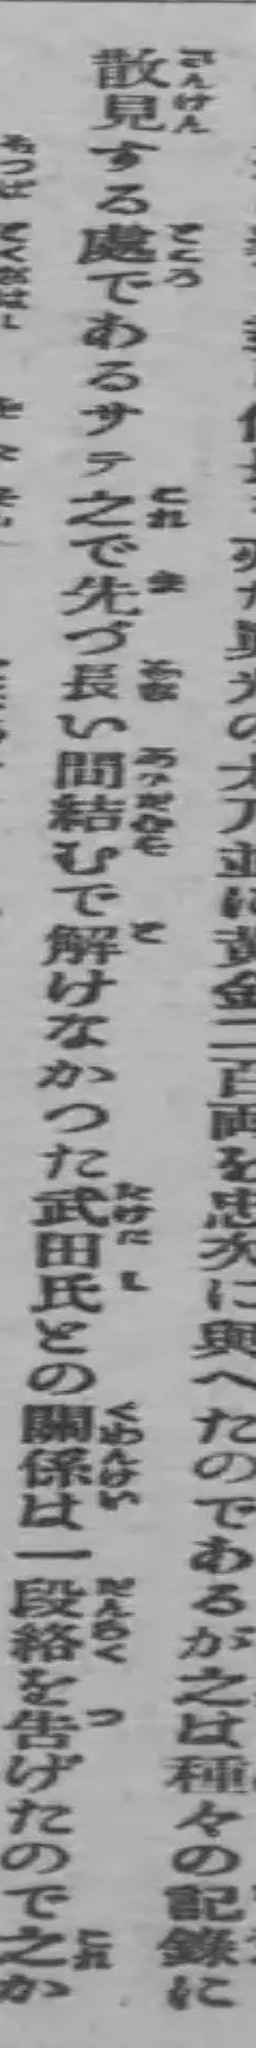散見する処であるサテ之で先づ長い間結むで解けなかつた武田氏との関係は一段落を告げたので之か
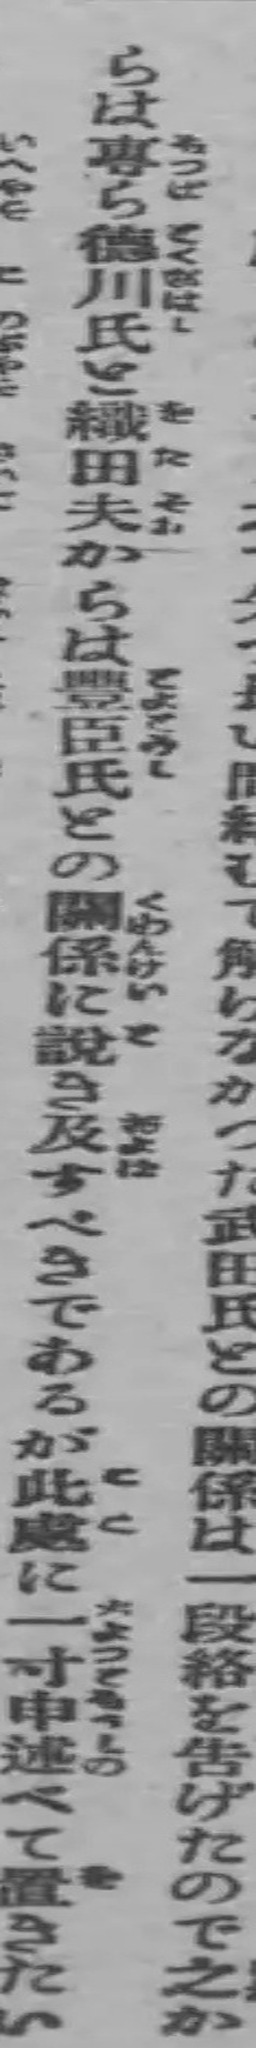らは専ら徳川氏と織田夫からは豊臣氏との関係に説き及すべきであるが此処に一寸申述べて置きたい
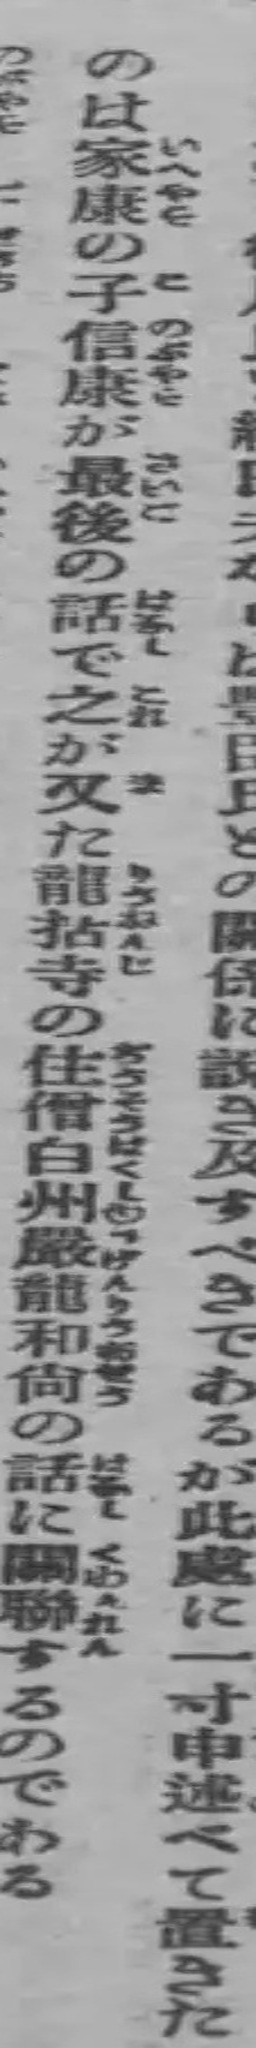のは家康の子信康が最後の話で之が又た龍拈寺の住僧白州厳龍和尚の話に関連するのである
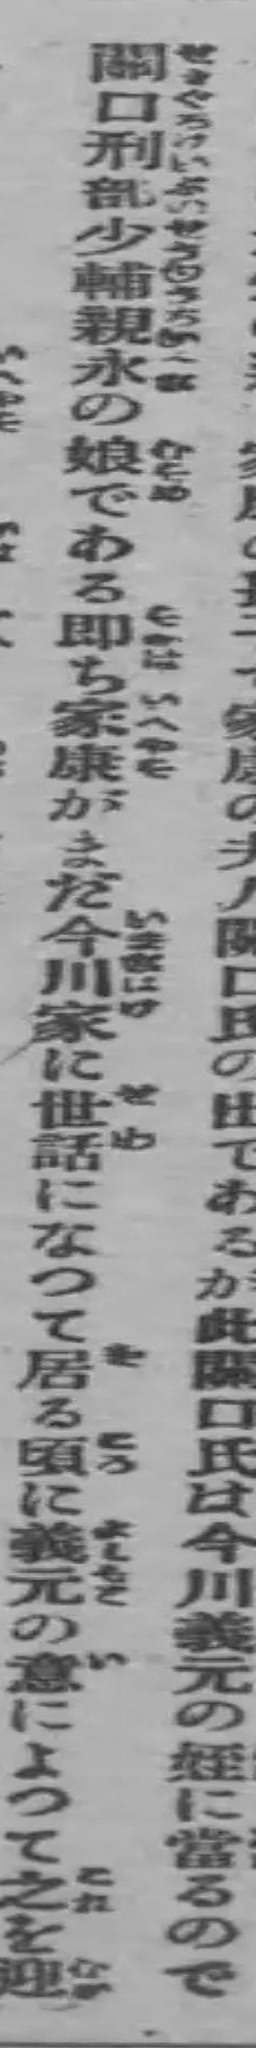関口刑部少輔親永の娘である即ち家康がまだ今川家に世話になつて居る頃に義元の意によつて之を迎
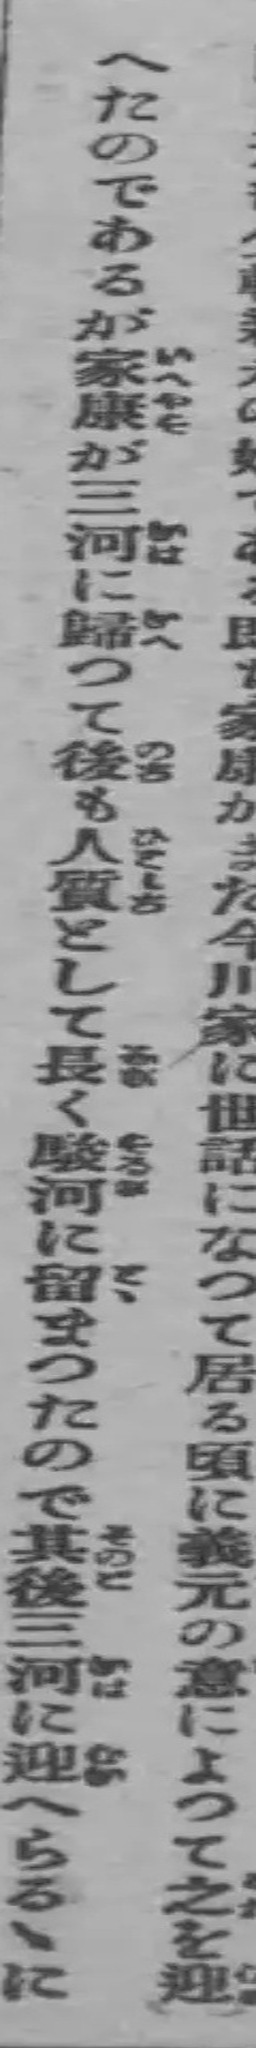へたのであるが家康が三河に帰つて後も人質として長く駿河に留まつたので其後三河に迎へらるゝに
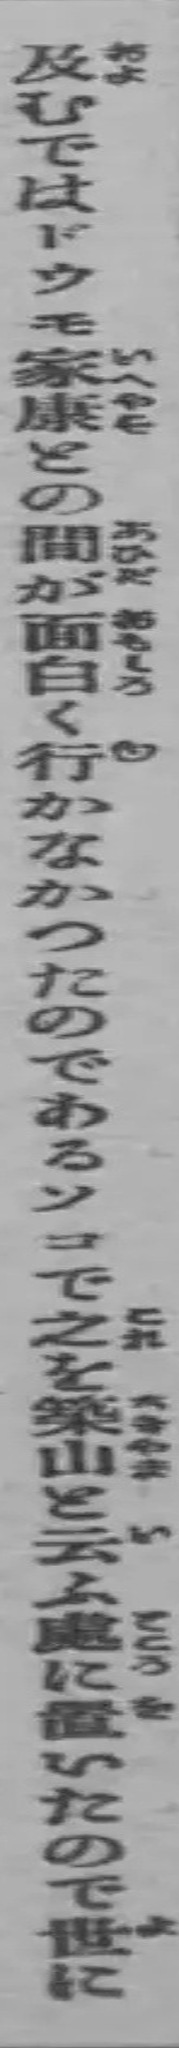及むではドウモ家康との間が面白く行かなかつたのであるソコで之を築山と云ふ処に置いたので世に
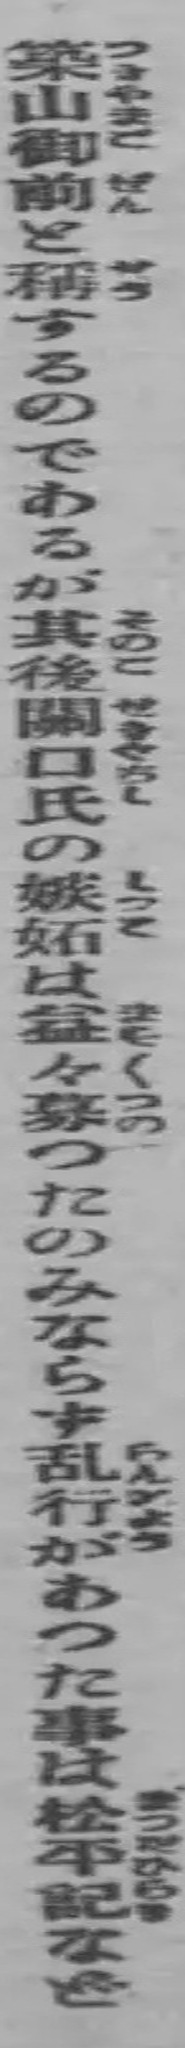築山御前と称するのであるが其後関口氏の嫉妬は益々募つたのみならず乱行があつた事は松平記など
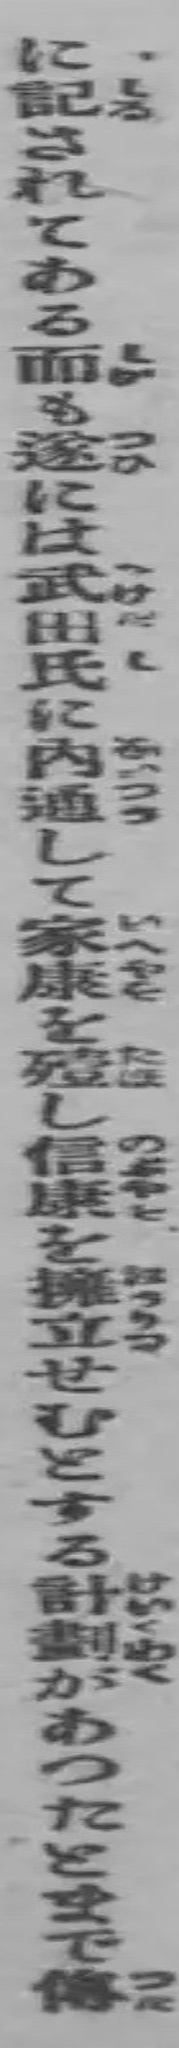に記されてある而も遂には武田氏に内通して家康を殪し信康を擁立せむとする計画があつたとまで伝
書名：豊橋市史談
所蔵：国立国会図書館 National Diet Library, JAPAN
